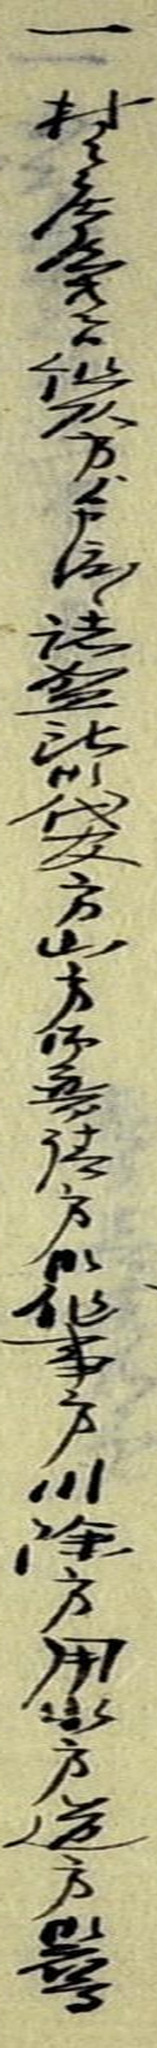一村々庄屋共ニハ組頭方ゟ申渡候諸盛銀御代官方山方御普請方御作事方川除方用水方道方御鷹
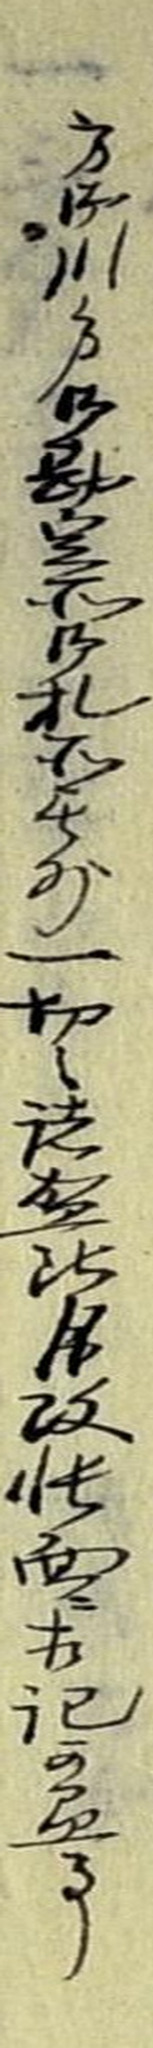方御川方御勘定所御札所其外一切之諸盛銀月改帳面ニ相記可置事
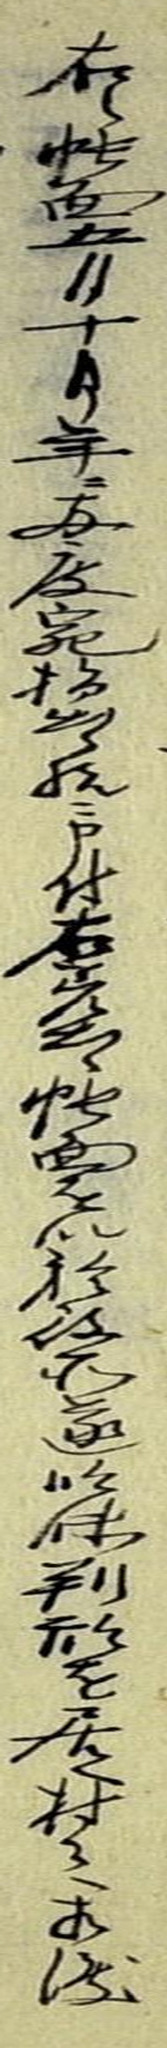右之帳面五月十月年ニ両度宛指出候様申付右差出候帳面を以於役所遂吟味判形を居村々へ相渡
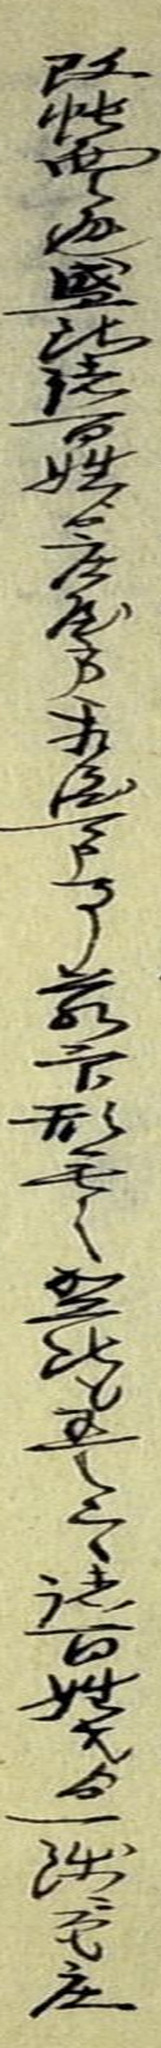改帳面之通盛銀諸百姓ゟ庄屋方へ相渡可申事若印形無之盛銀も有之候ハヽ諸百姓共ゟ一銭ニ而も庄
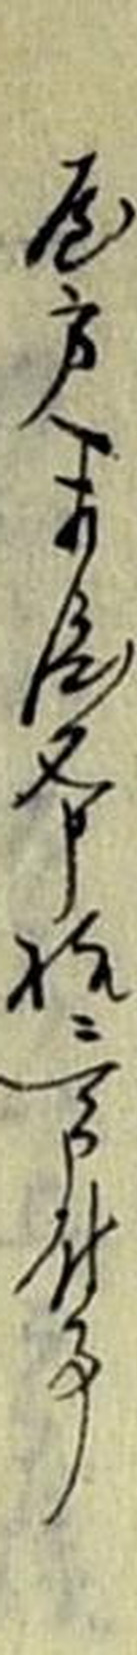屋方へ相渡不申様ニ可申付事
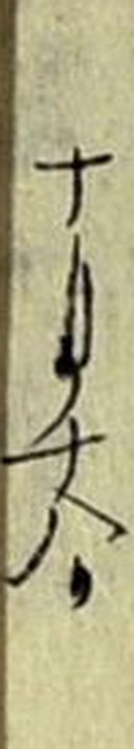十月十八日
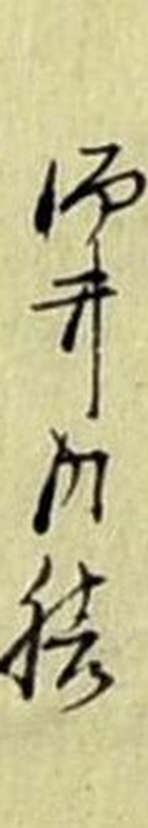酒井内膳
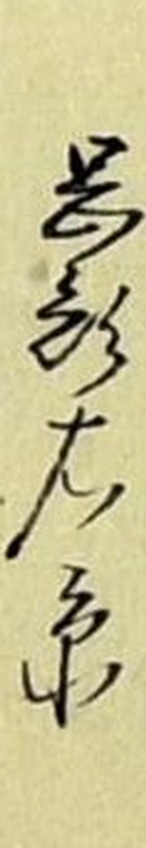岡部右京
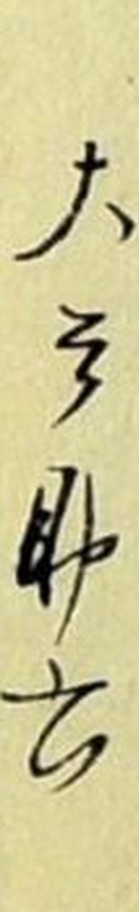大谷助六
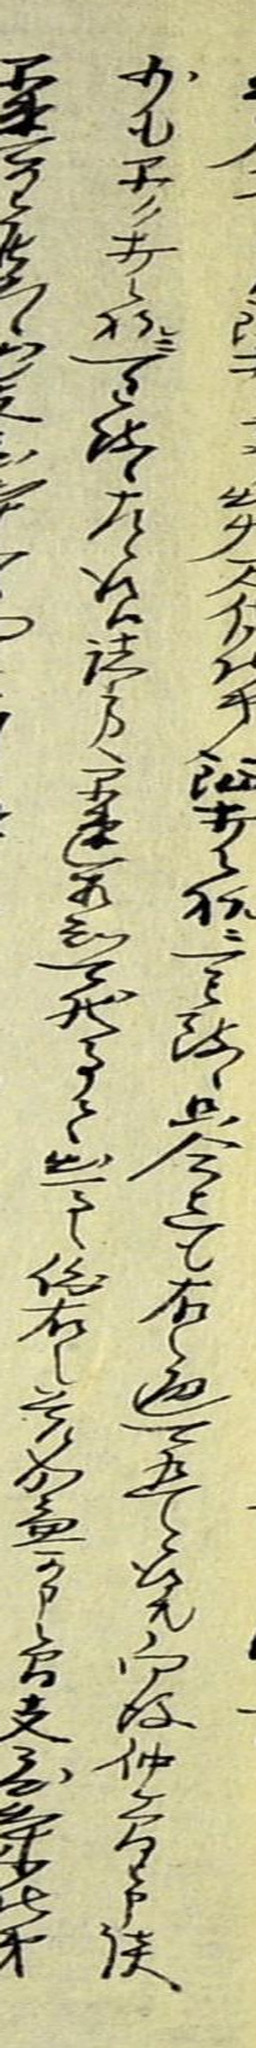少も早ク打候様ニ可被致候左候得ハ諸方へ早速相知可然事ニ候出馬之儀右之節成兼可申候間支度出来次第
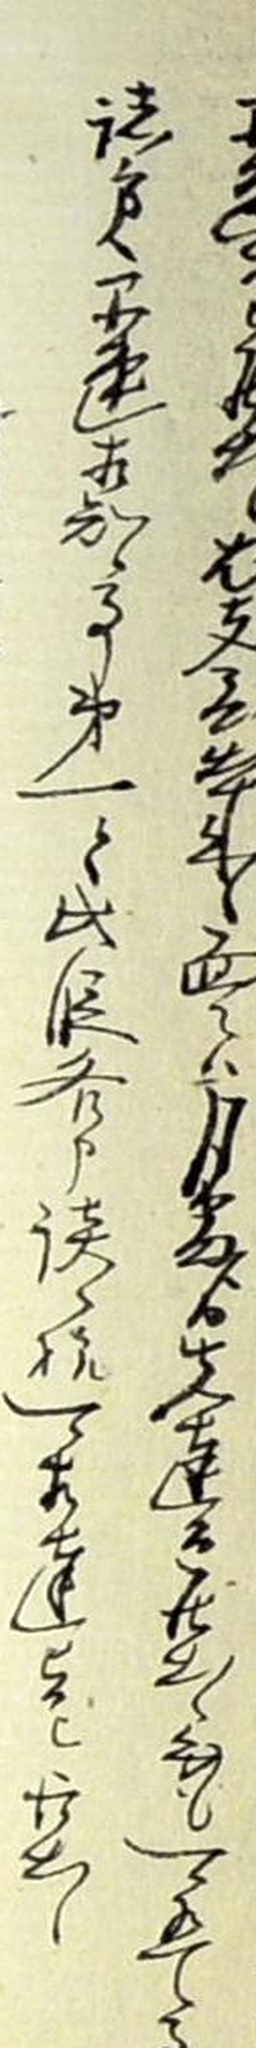諸方へ早速相知候事第一ニ候此段各申談候様可相達旨被仰出候
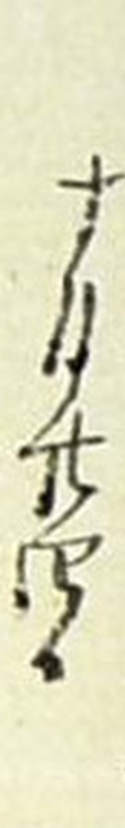十月廿四日

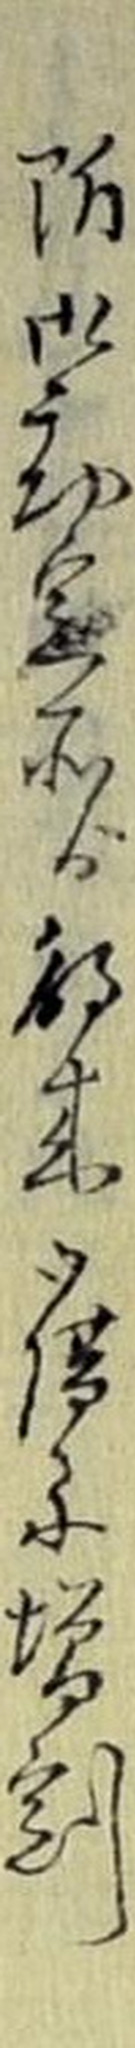附御勘定所ゟ触来御借米増割
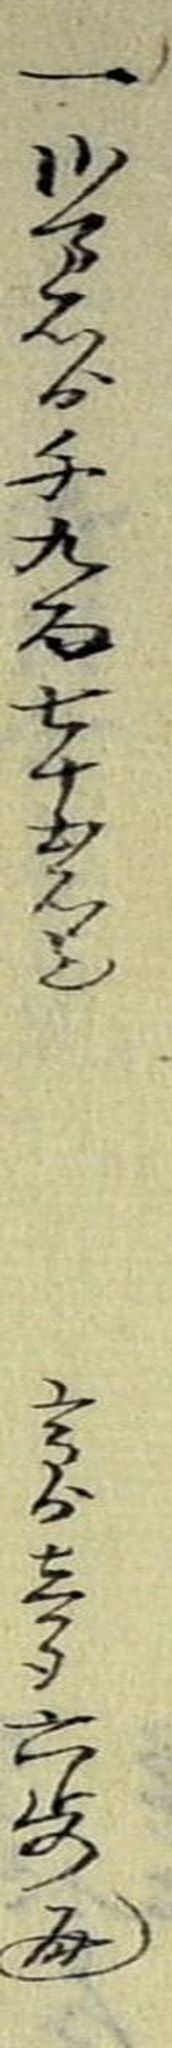一弐万石ゟ千九百七十五石迄高ゟ壱匁六歩通
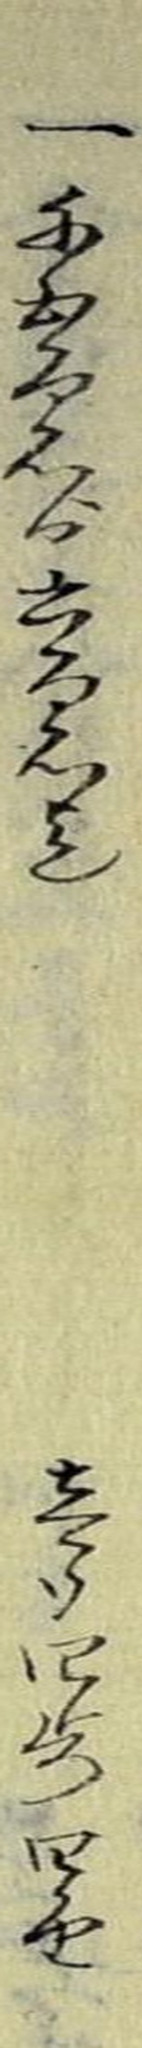一千五百石ゟ六百石迄壱匁四歩四厘
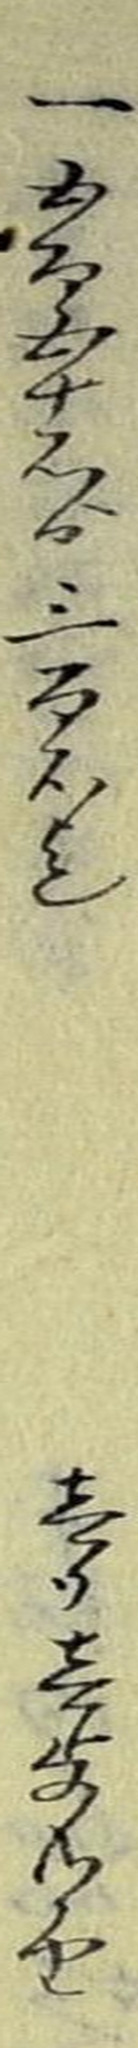一五百五十石ゟ三百石迄壱匁壱歩弐厘
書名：命令之部 一
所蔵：福井県文書館 Fukui Prefectural Archives
